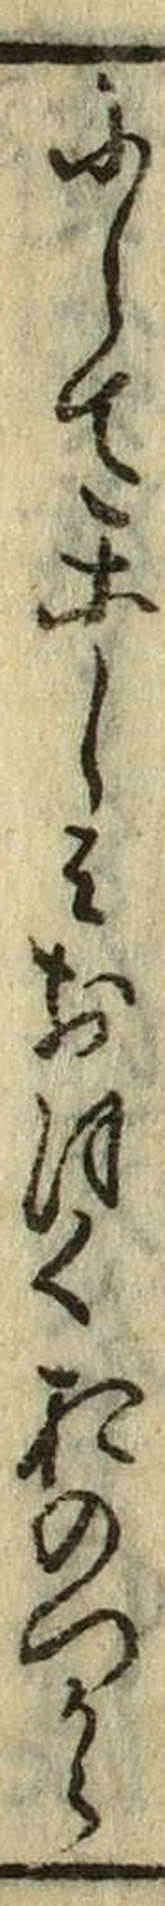にして楽しみおほくおのづから
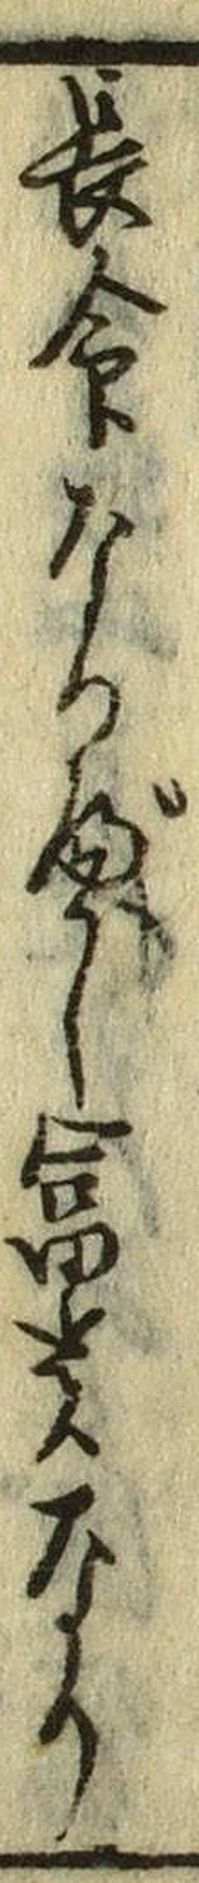長命なるべし富貴なり
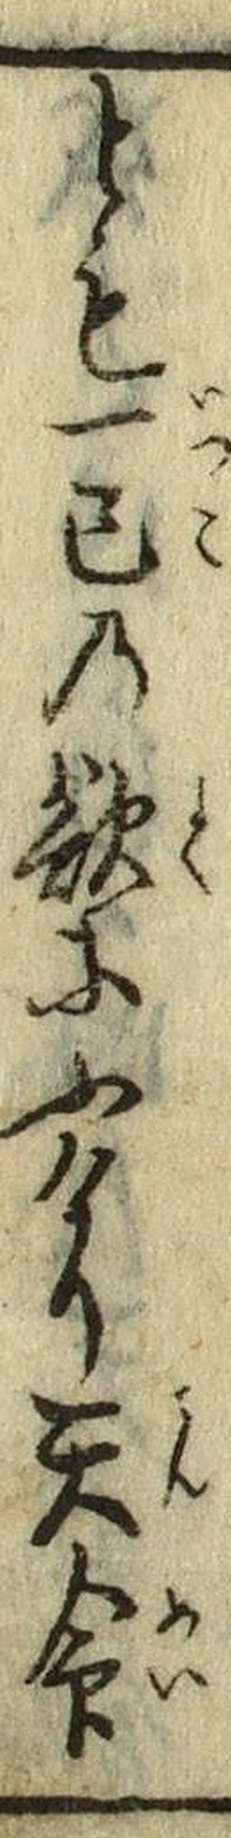とも一己の欲にふけり天命
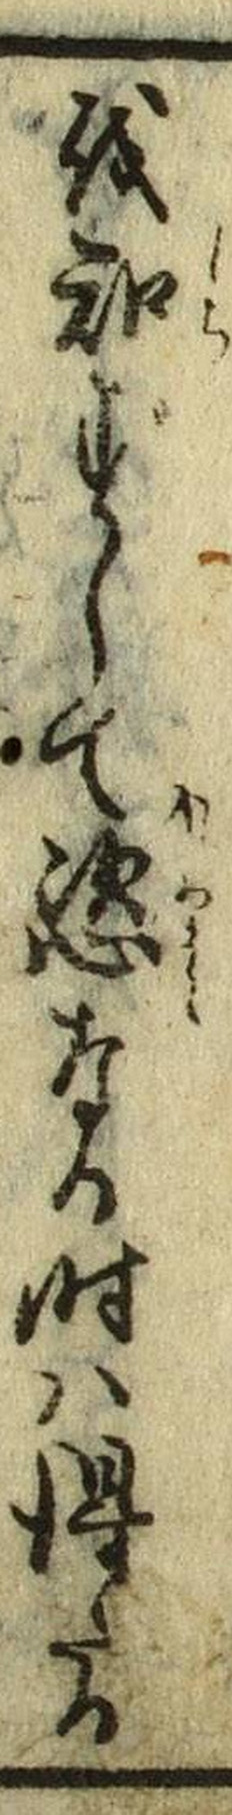を知ずして恣なる時は得たる
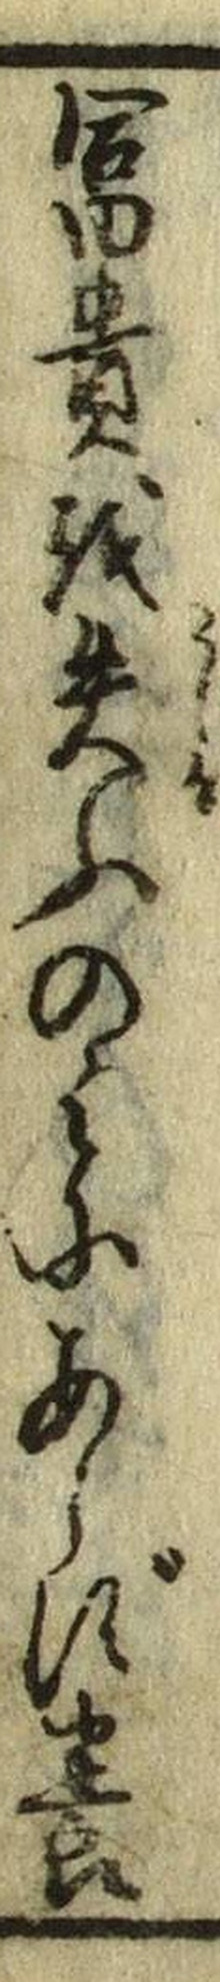富貴を失ふのみにあらず養

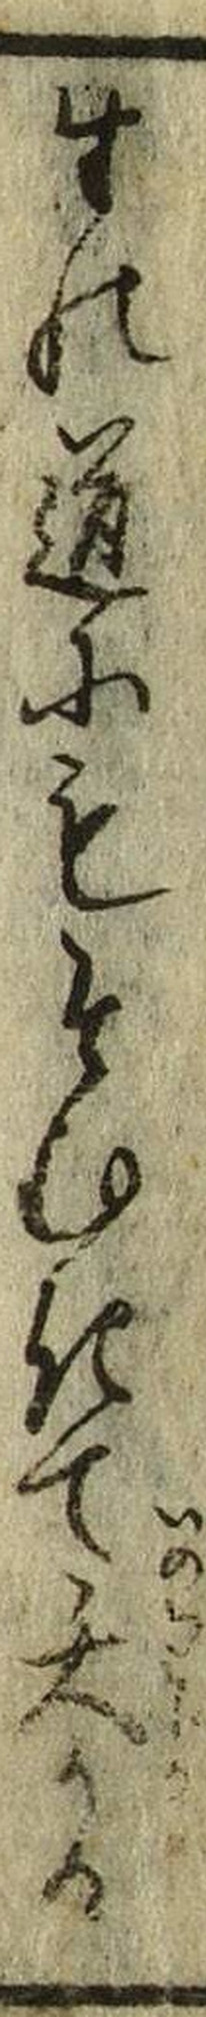生の道にもそむきて夭かる
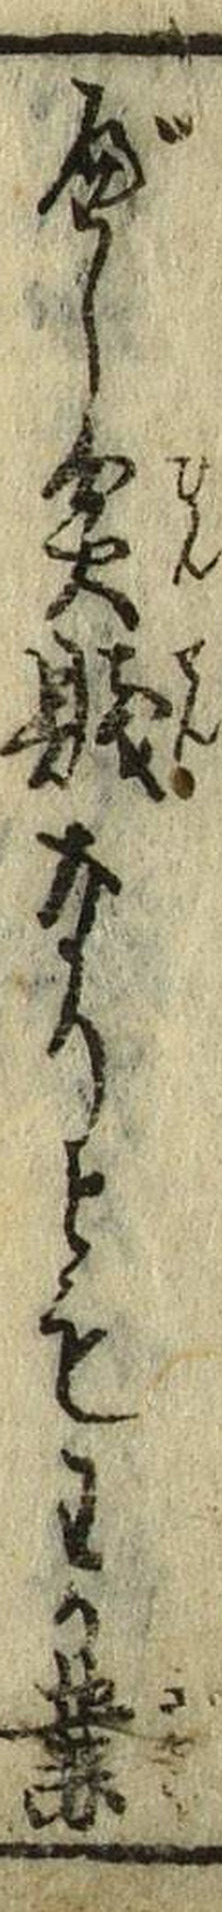べし貧賤なりともわか業
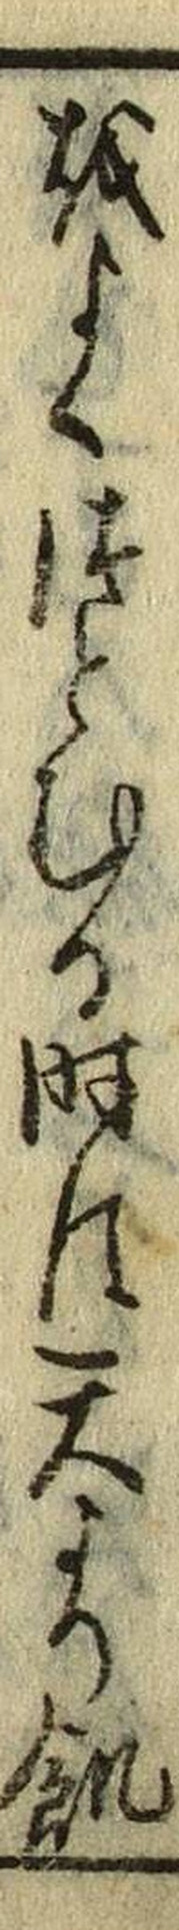をよくつとむる時は天より飢
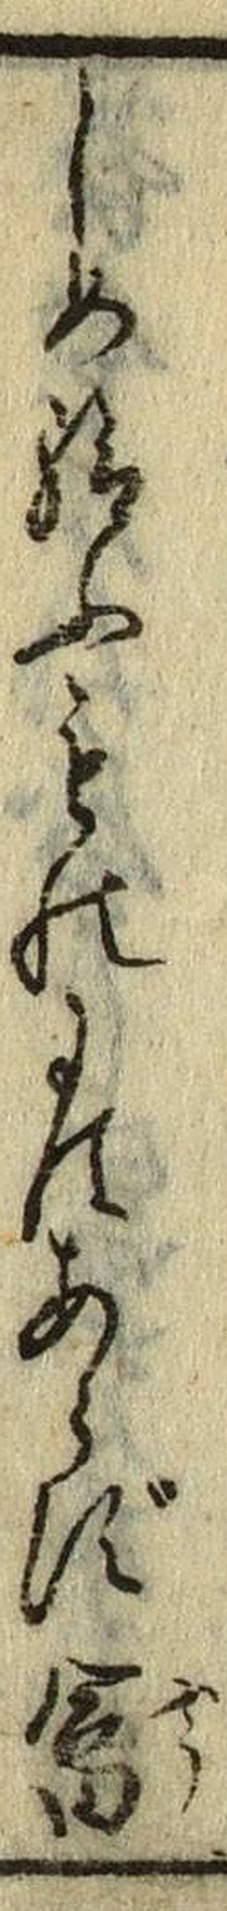しめ給ふものにはあらず富
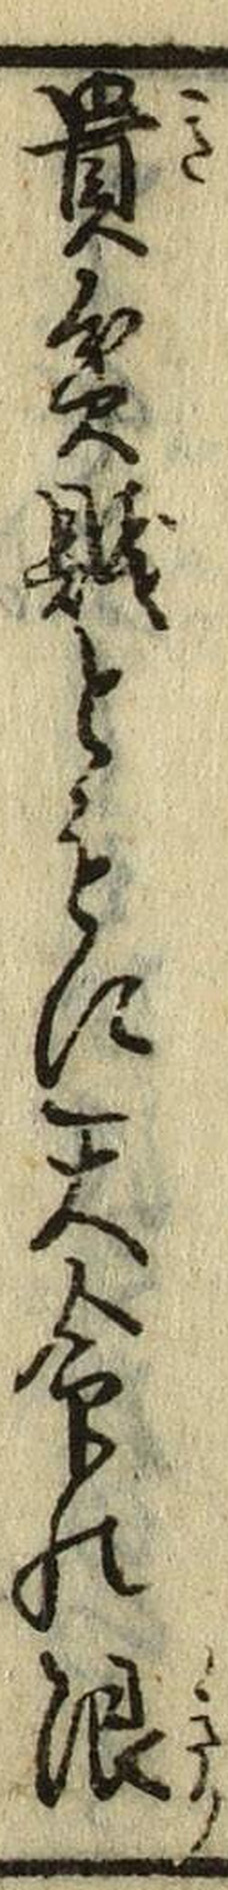貴貧賤ともに天命の限
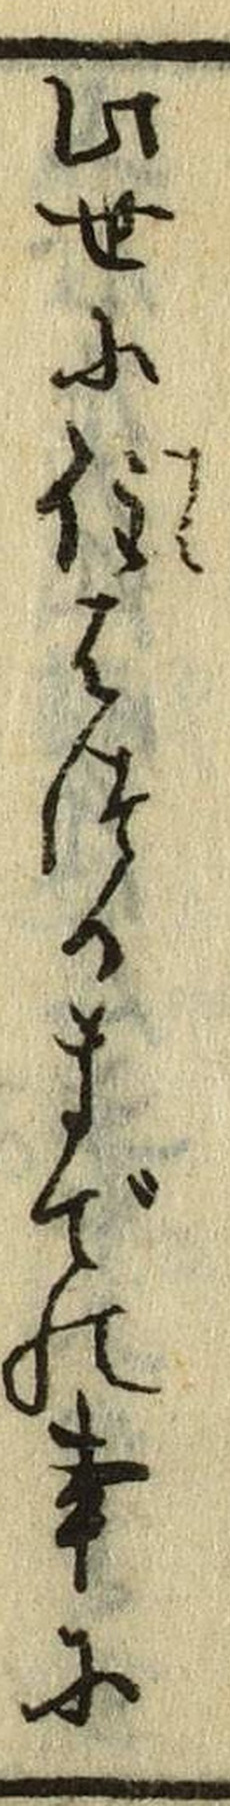此世に住はつるまでの事に
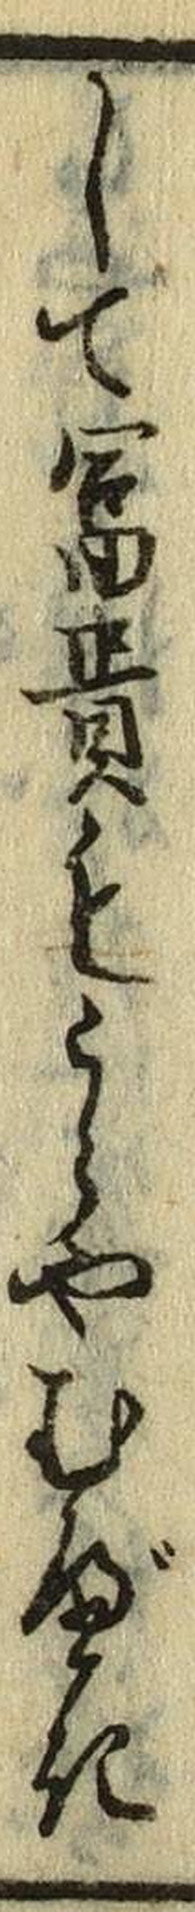して富貴もうらやむべき
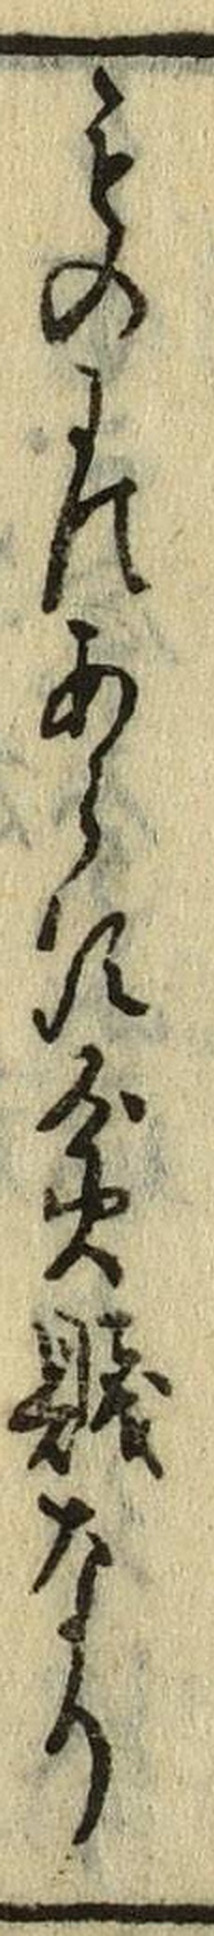ものにはあらす貧賤なり
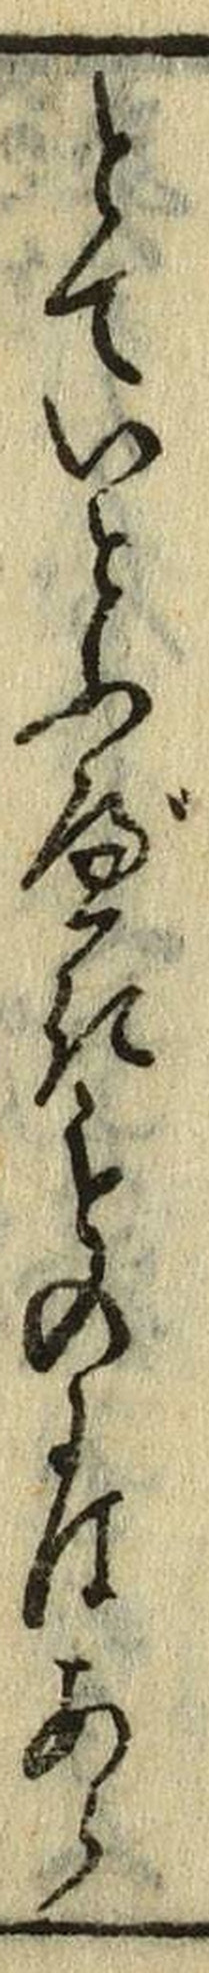とていとふべきものにはあら
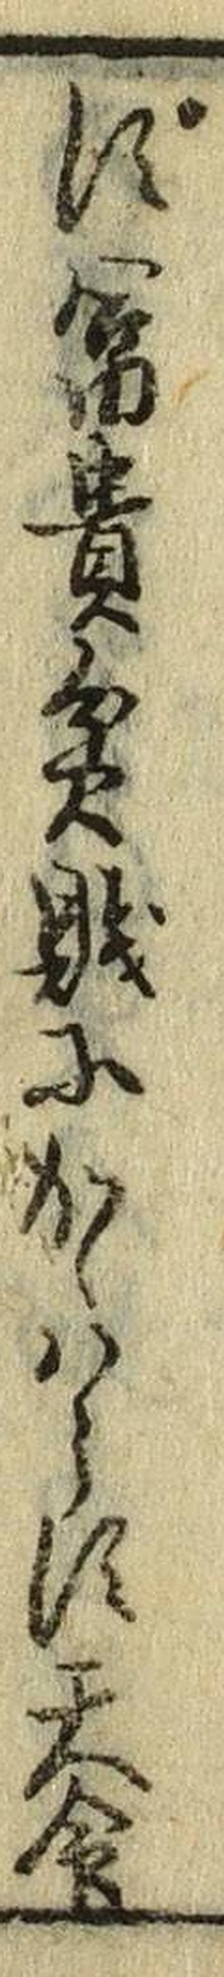ず富貴貧賤にかゝはらす天命
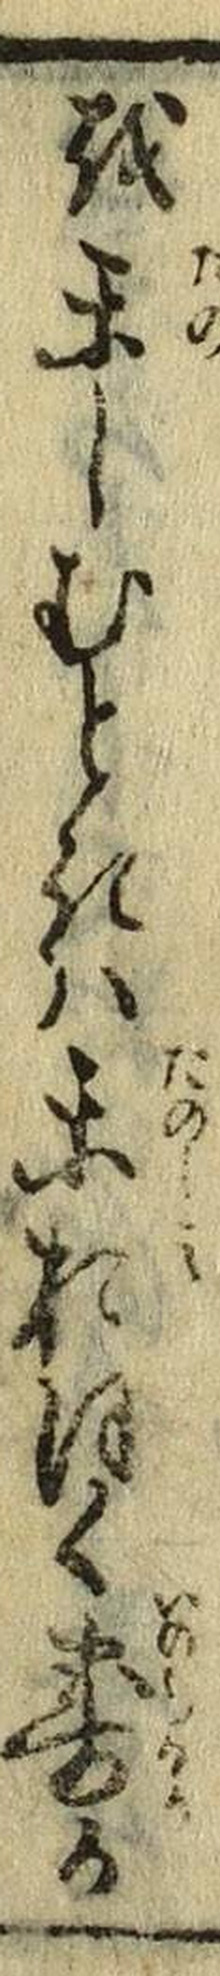を楽しむときは楽おほく寿か
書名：居家養生記
